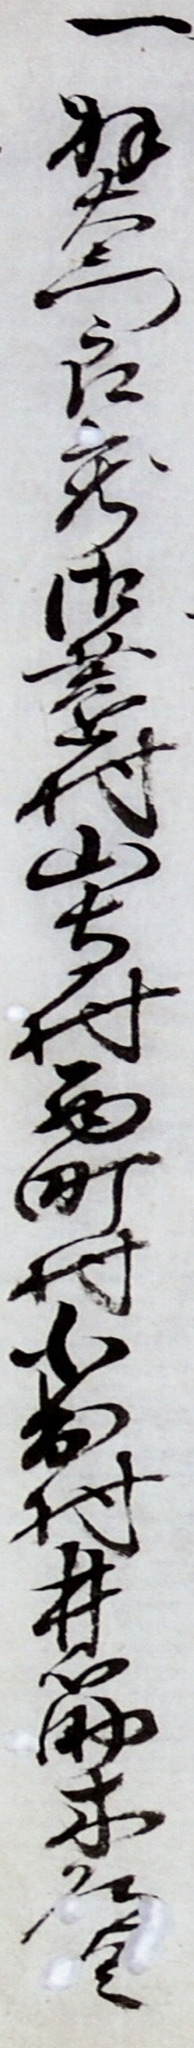一羽右衛門良蔵御蓑村山ち村西町村小出村井筋木道具
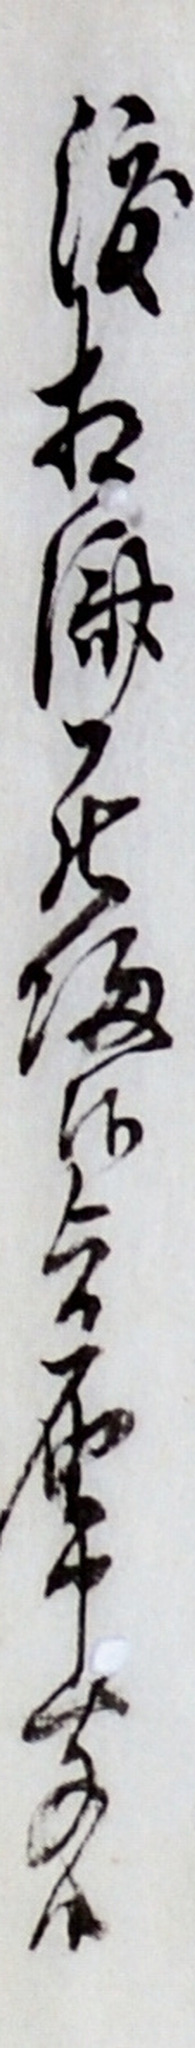渡相済罷帰候旨届申聞候

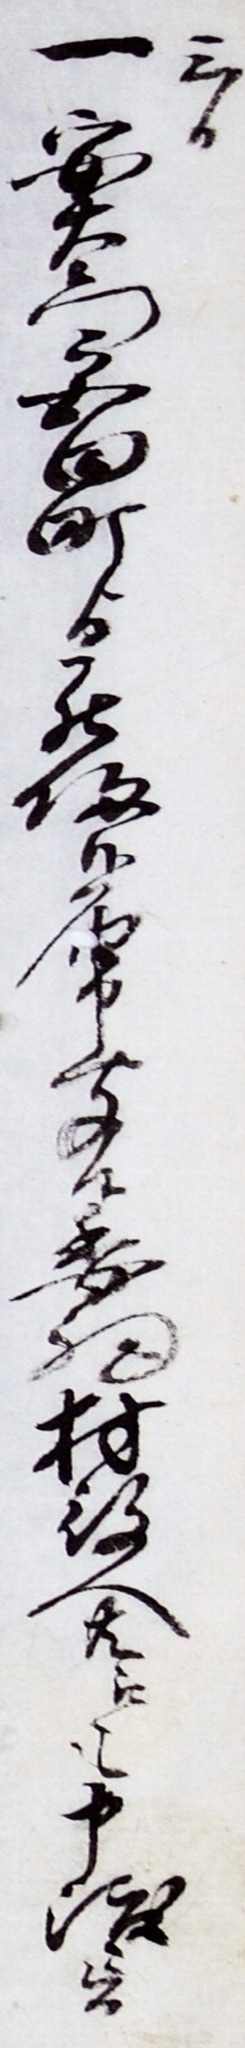一安右衛門宮田町より罷帰候届申聞候委細村役人共江も申渡旨
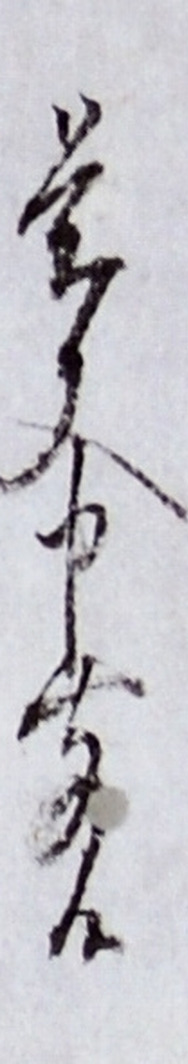是又申聞候
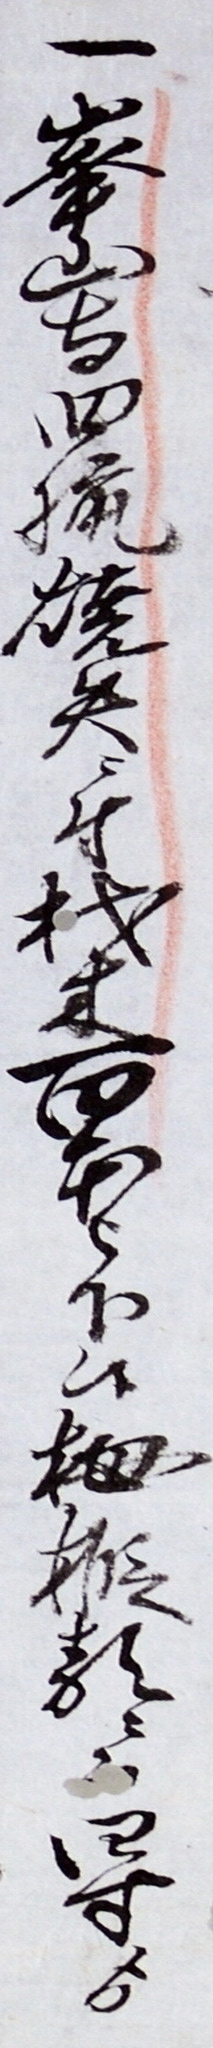一峯山寺旧腕焼失ニ付材木百本被下候梅桜類ニ而四寸より
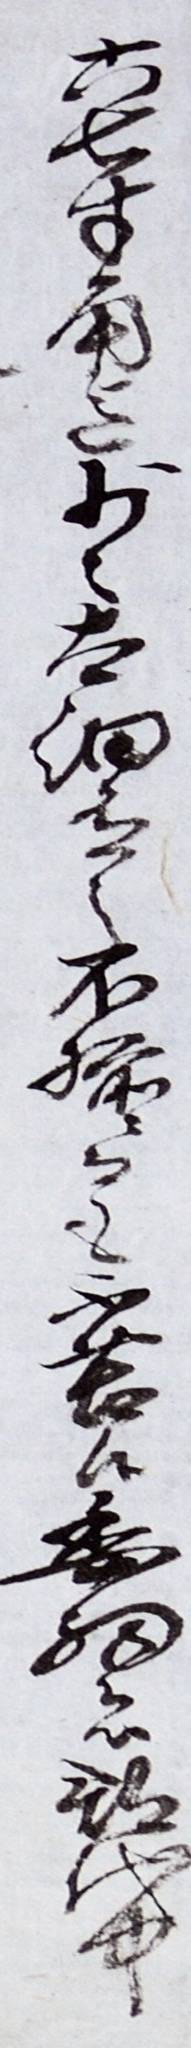六七寸角迄少々太細有之不揃ニ而も不苦候委細而は郡代中
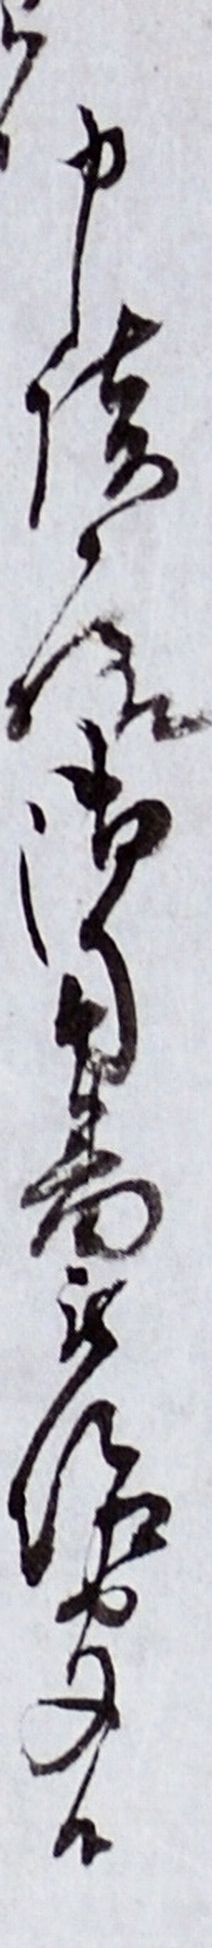申談候様御用番被仰聞候
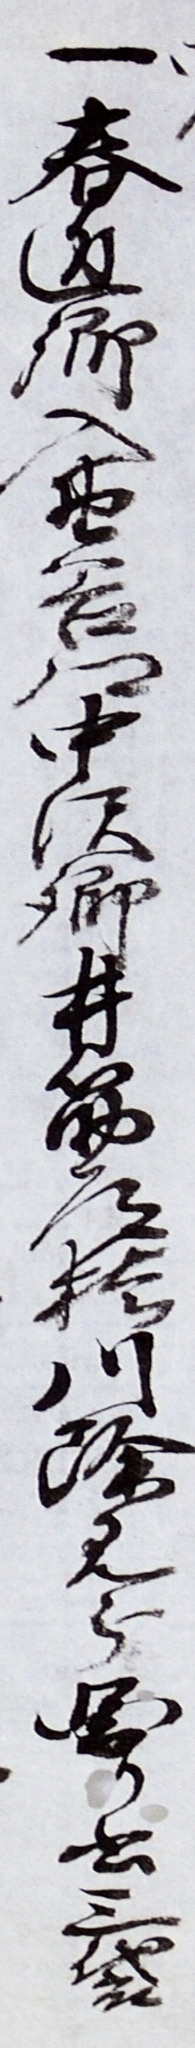一春近郷入野谷郷中沢郷井筋常道袴川除見分図り書三袋
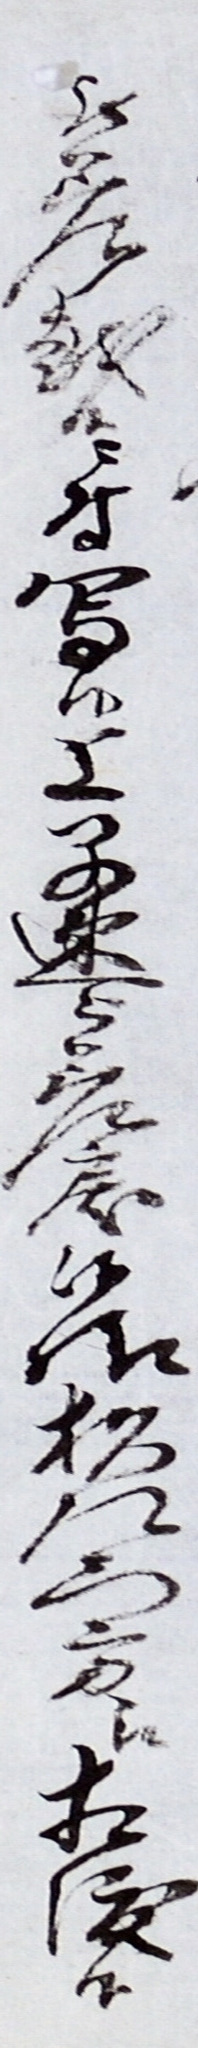被差越候ニ付写候上早速被差戻候様杉左衛門方江相渡候
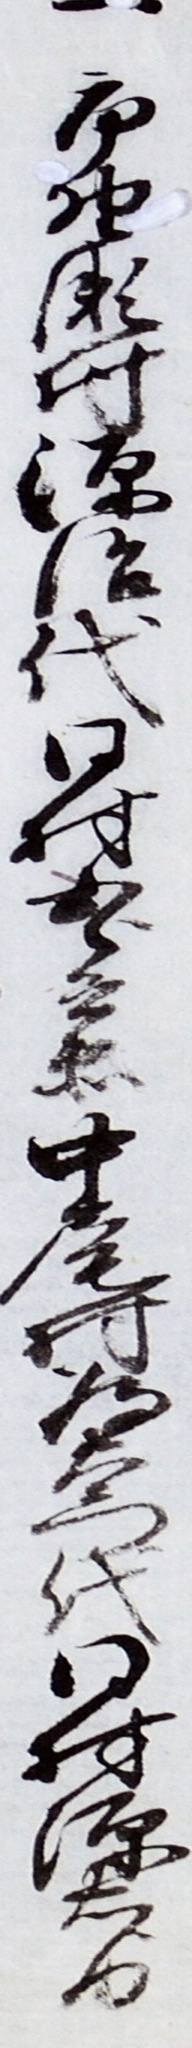一市野瀬村源治代同村五郎兵衛中尾村為右衛門代同村源右衛門
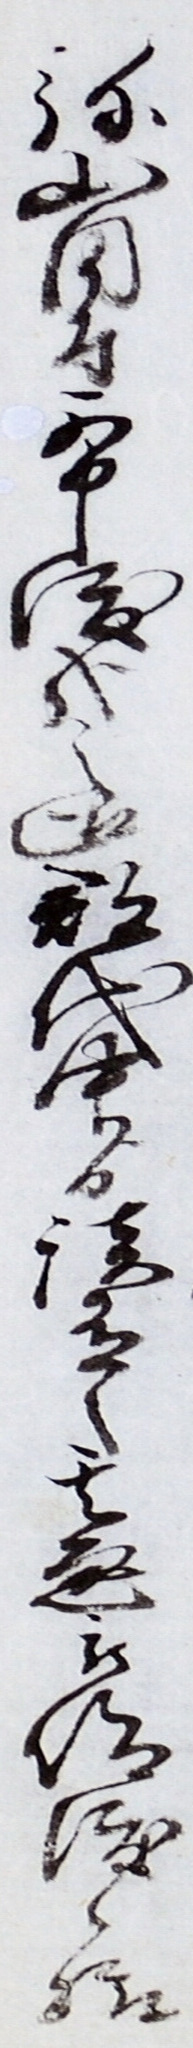弥山目付可申渡哉之趣郡代中より談有之其応被仰渡候様
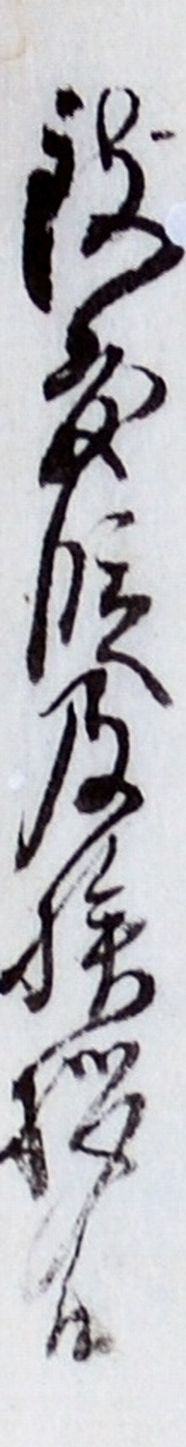致度段及挨拶候
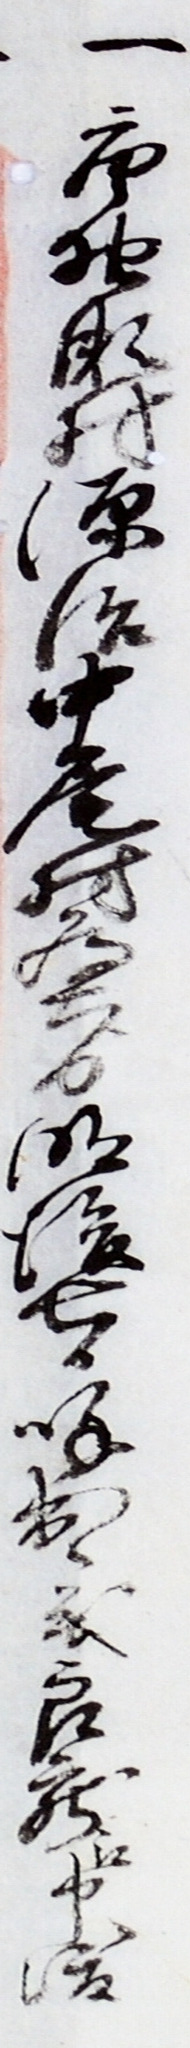一市野瀬村源治中尾村為左衛門明後七日呼出候義良蔵江申渡
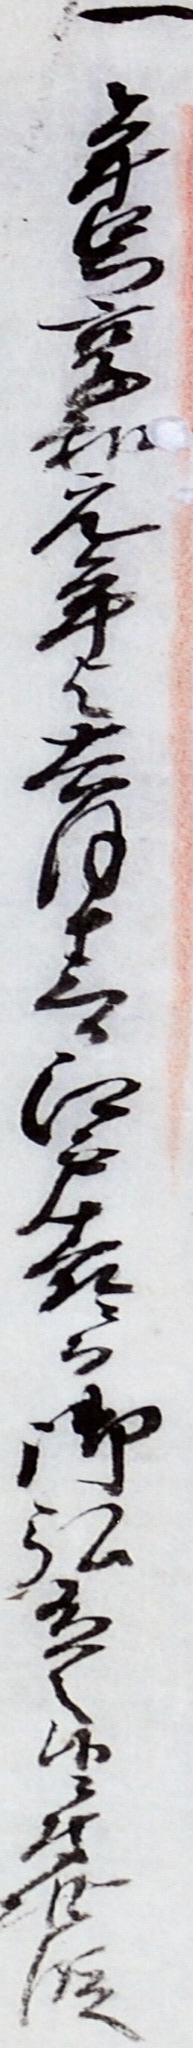一年号享和元年は去月十三日江戸表ニ而御弘有之候ニ付此段
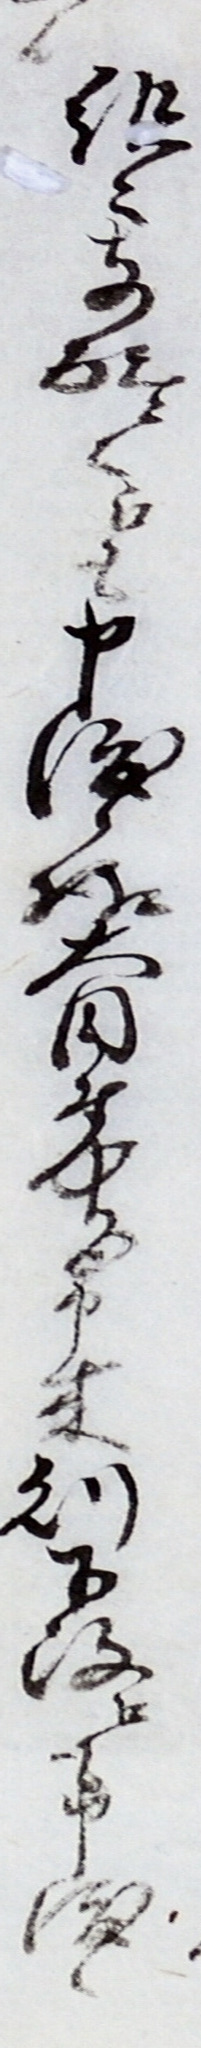組々支配ニ候而も申渡候様大目付中より申来則下役ニも申渡候
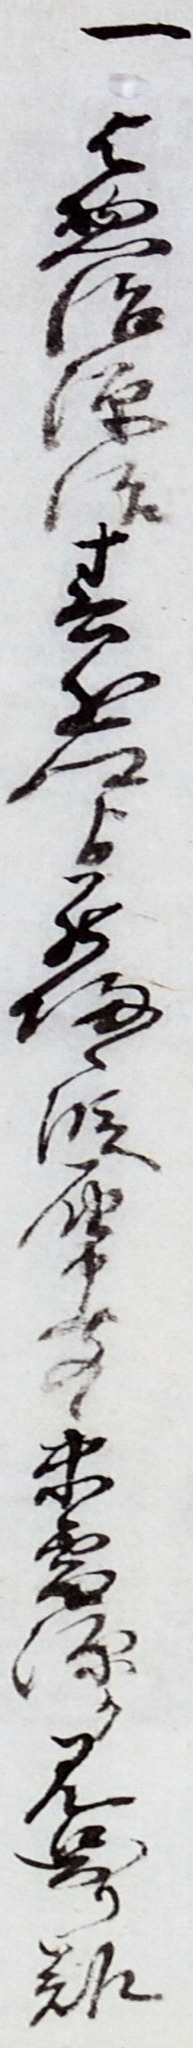一与惣治源治春近郷より罷帰候段届申聞候来雪深ク見廻り難
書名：御山奉行御用控
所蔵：伊那市立高遠町図書館・合同会社AMANE
